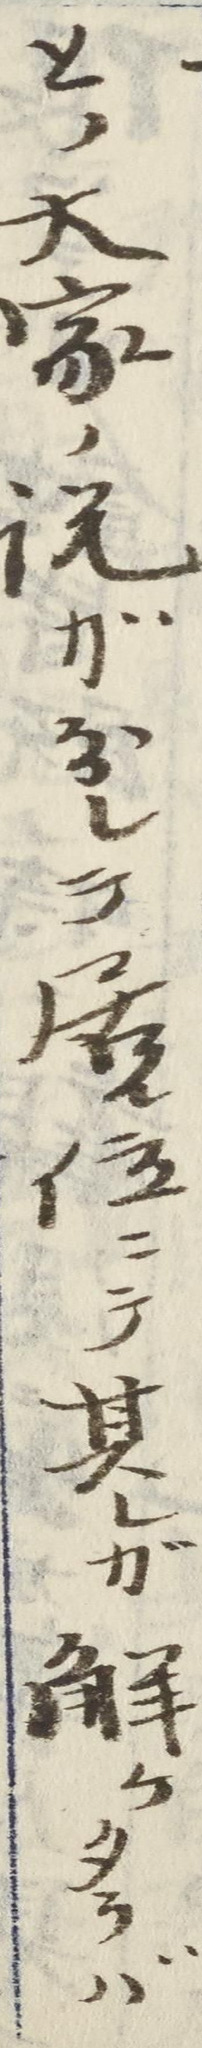とノ大家ノ説ガ分レテ居ㇽ位ニテ其レガ觧ヶタラバ
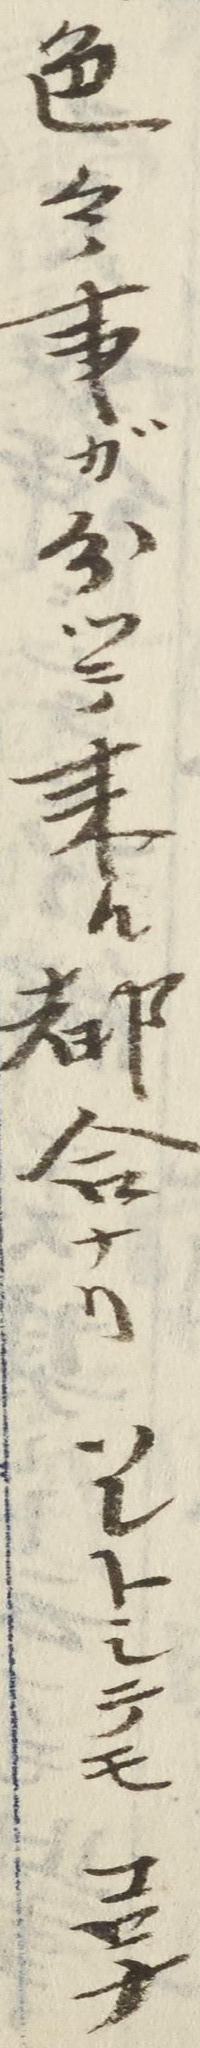色々ノ事が分ツテ来ㇽ都合ナリソレトシテモコロナ

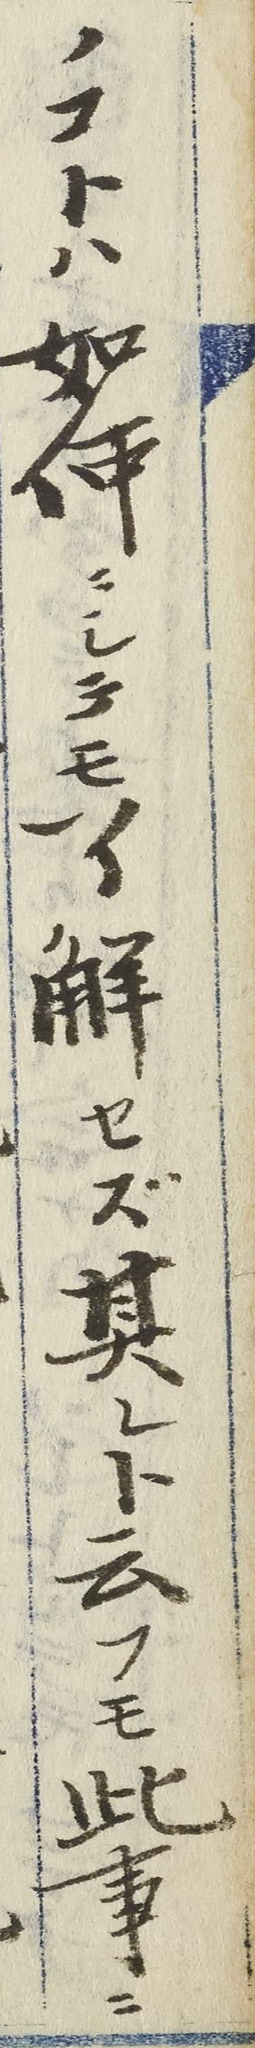ノコトハ如何ニシテモ了解セズ其レト云フモ此事ニ
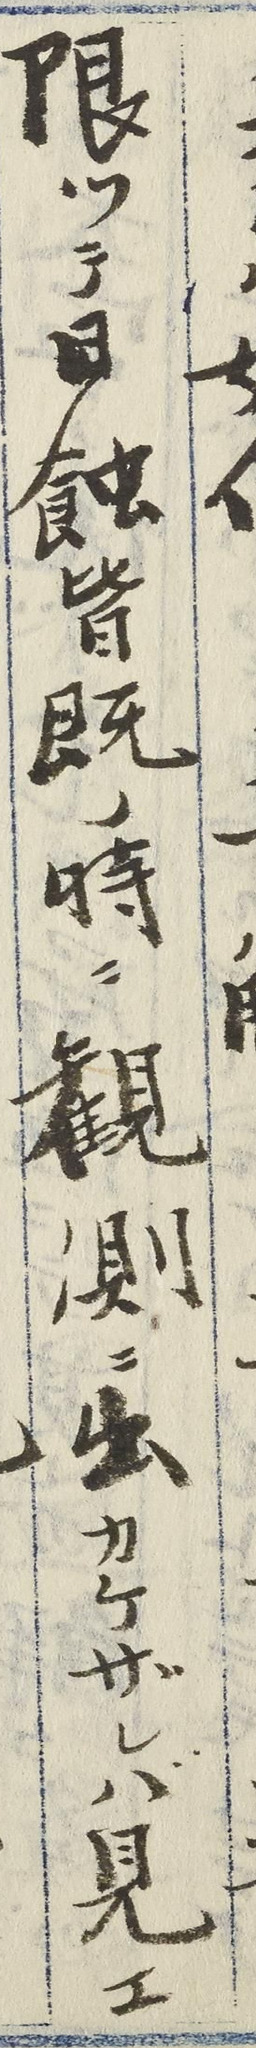限ツテ日蝕皆既ノ時二観測ニ出カケザレバ見エ
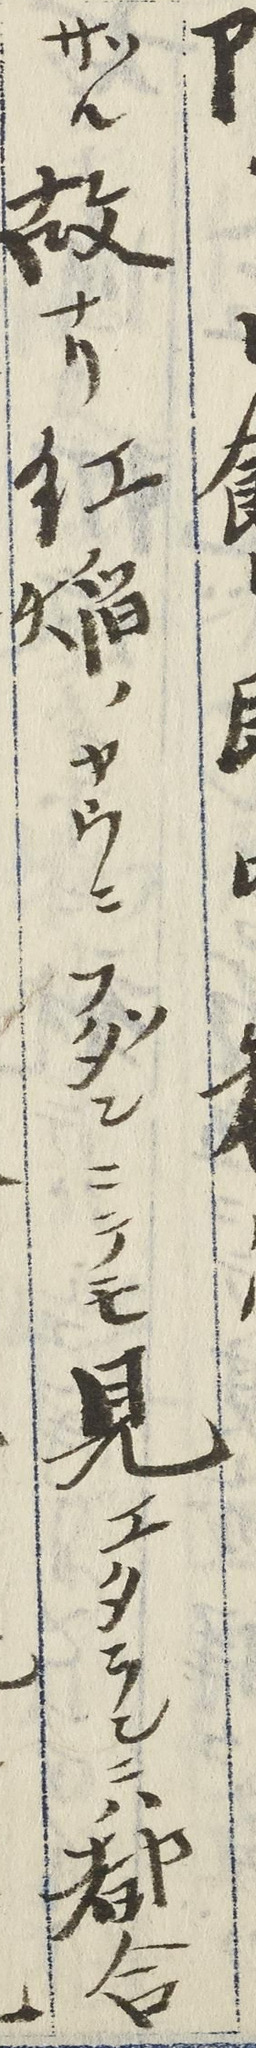ザル故ナリ紅焰ノヤウニフダンニテモ見エタランニハ都合
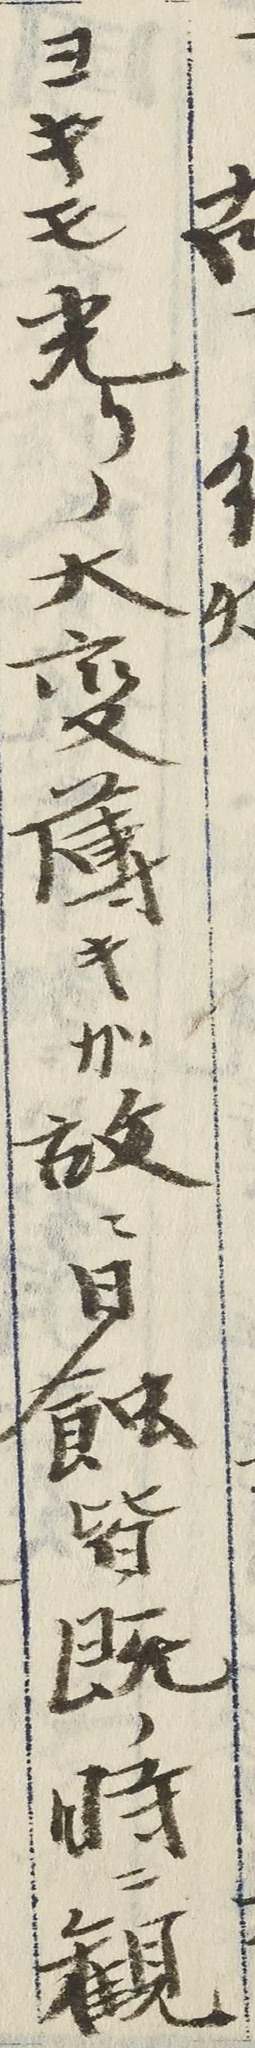ヨキモ光リノ大変薄キガ故ニ日蝕皆既ノ時二観
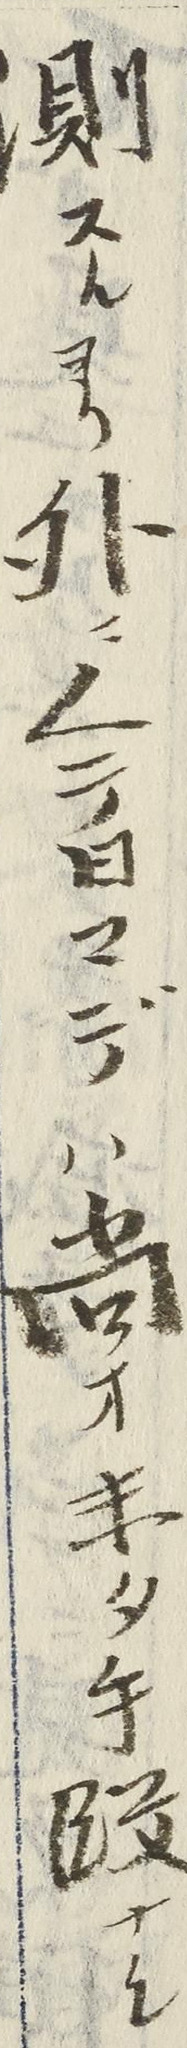測スルヨリ外ニ今日マデハ尚オ未タ手段ナシ
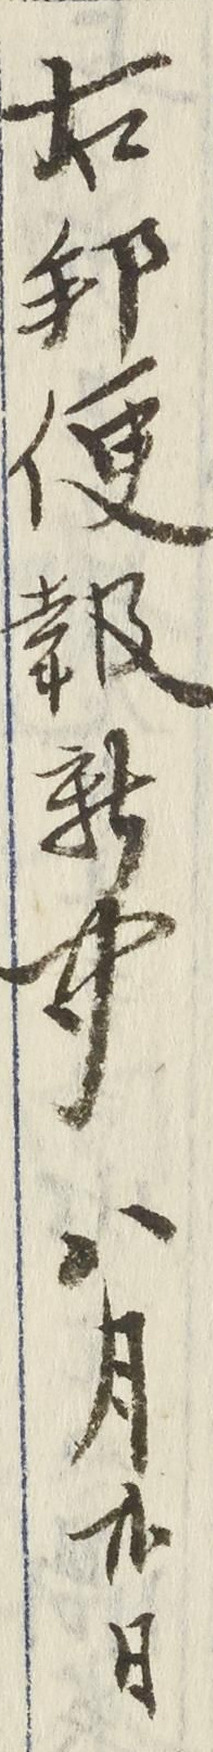右郵便報新聞八月廿日
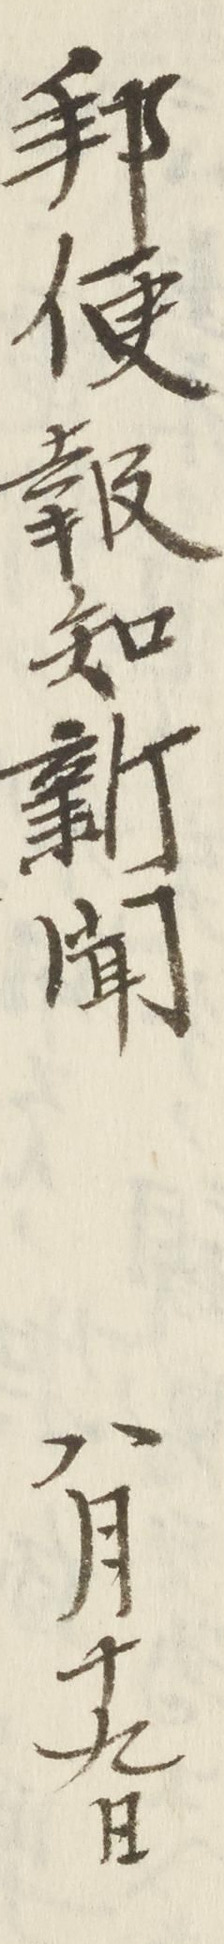郵便報知新聞八月十九日
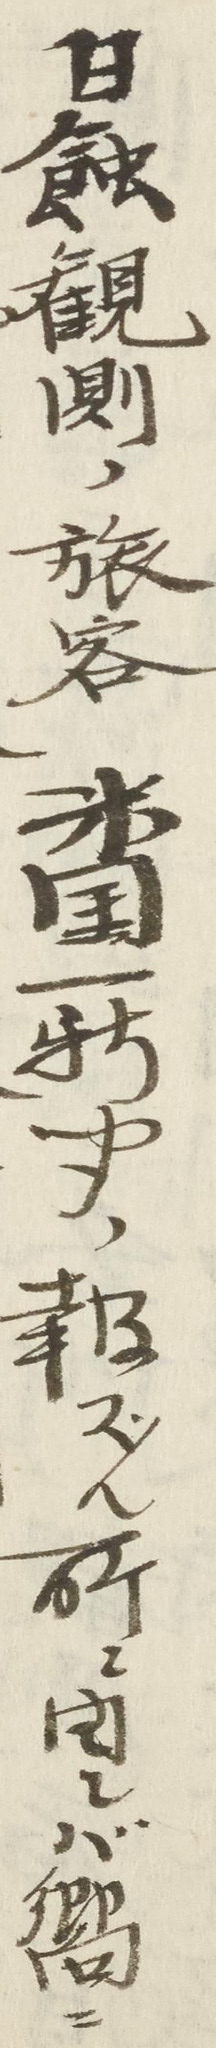日蝕観測ノ旅客米国一新聞ノ報ズル所ニ因レバ嚮ニ
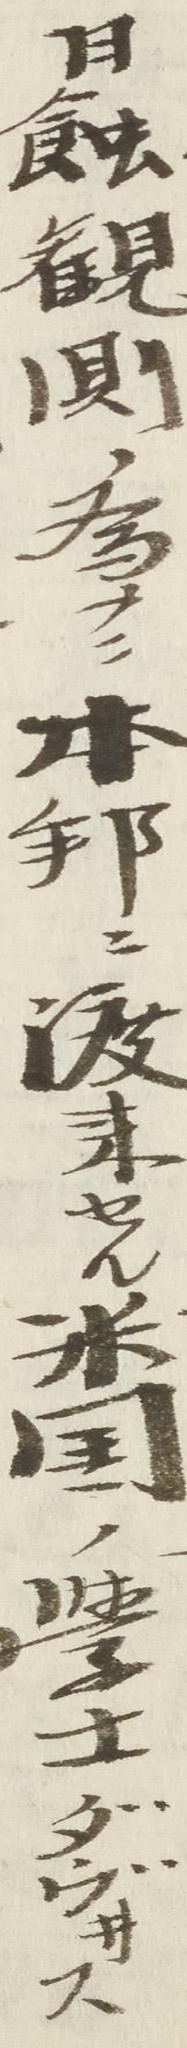日蝕観測ノ為メニ本邦ニ渡来セル米国ノ学士ダヴヰス
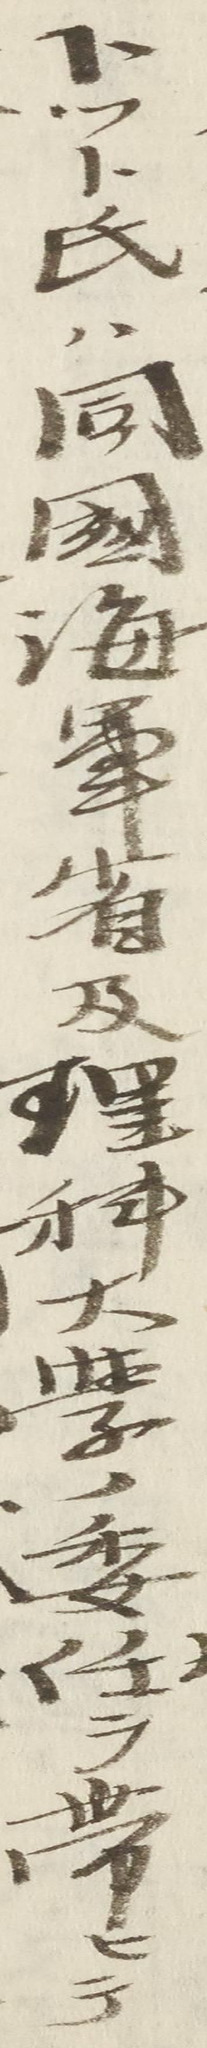トツト氏ハ同国海軍省及理科大学ノ委任ヲ帯ヒテ
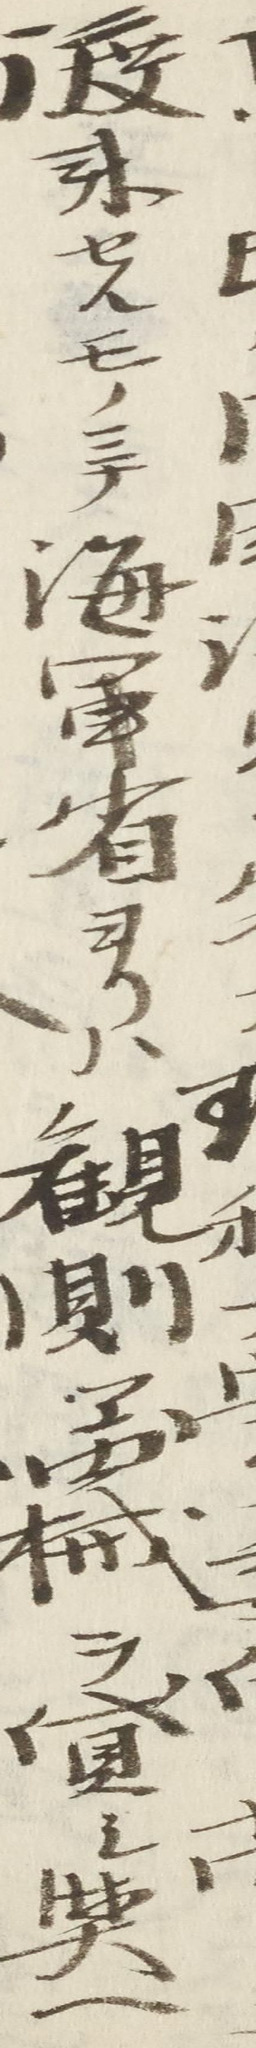渡来セルモノニテ海軍省ヨリハ観測器械ヲ貸シ与ヘ
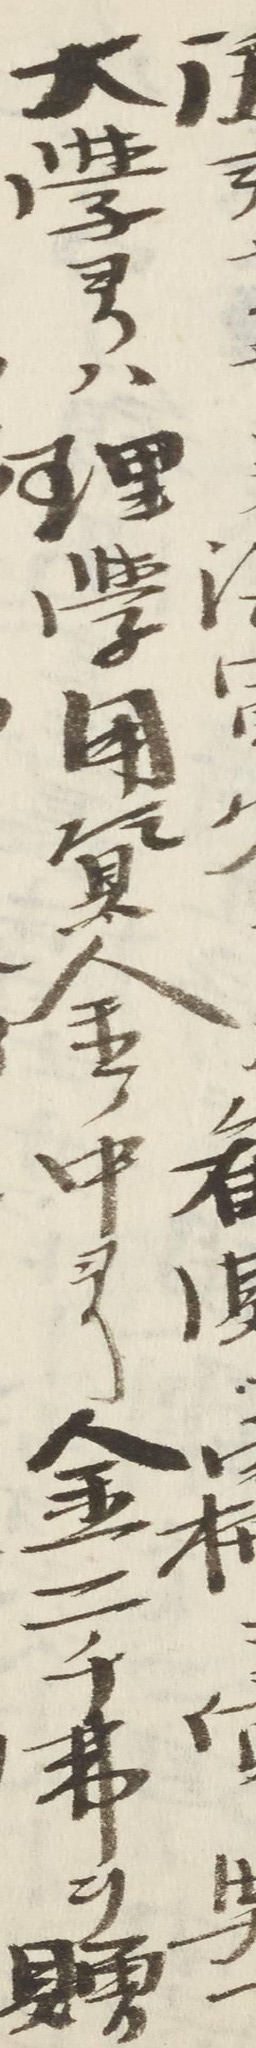大学ヨリハ理学用資金ノ中ヨリ金二千弗ヲ贈
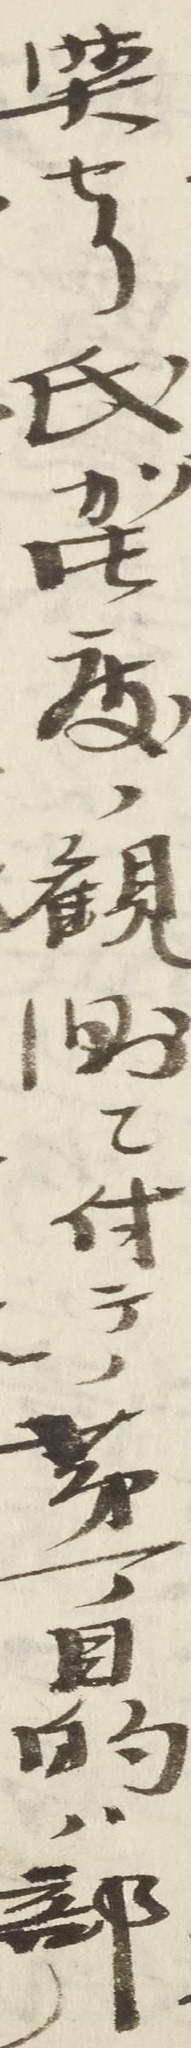与セリ氏ガ此度ノ観測ニ付テノ第一ノ目的ハ部
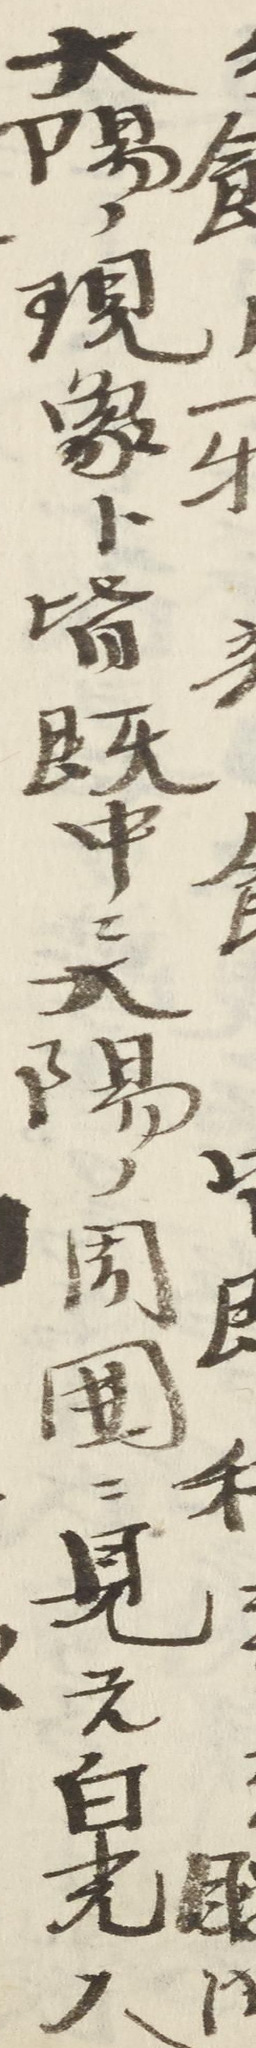大陽ノ現象ト皆既中ニ大陽ノ周囲ニ見ユル白光ノ
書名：日蝕録　全
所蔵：東京大学地震研究所図書室 Earthquake Research Institute Library, The University of Tokyo, JAPAN
